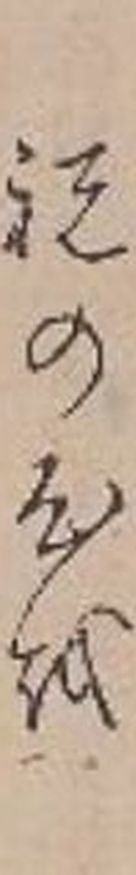祝の心を
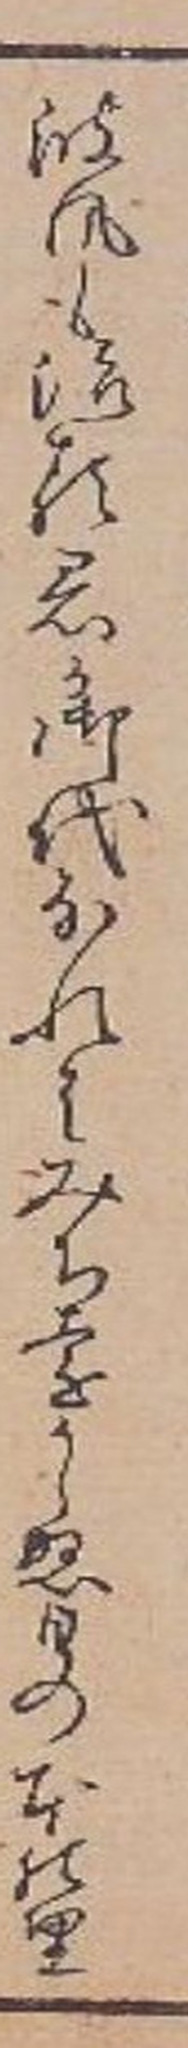波風も治る君か御代なれはみち遠からぬ日の本の里
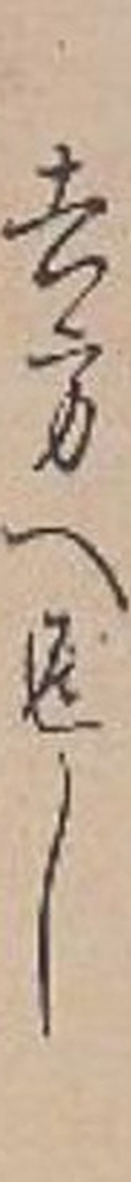去方へ返し
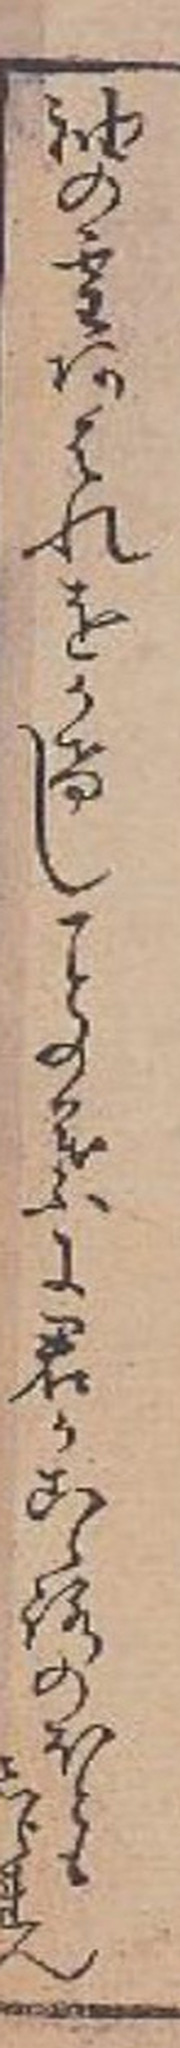袖の雪あはれをかけしことの葉に君かこゝろのほともしられん
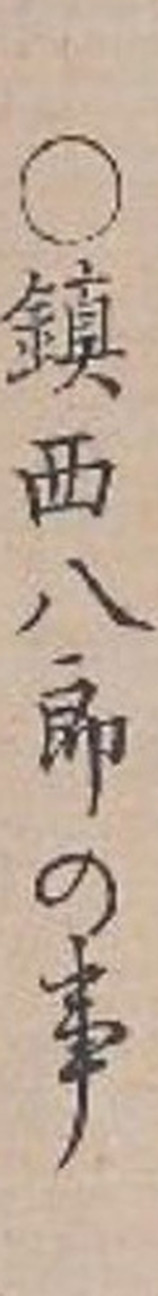○鎮西八郎の事
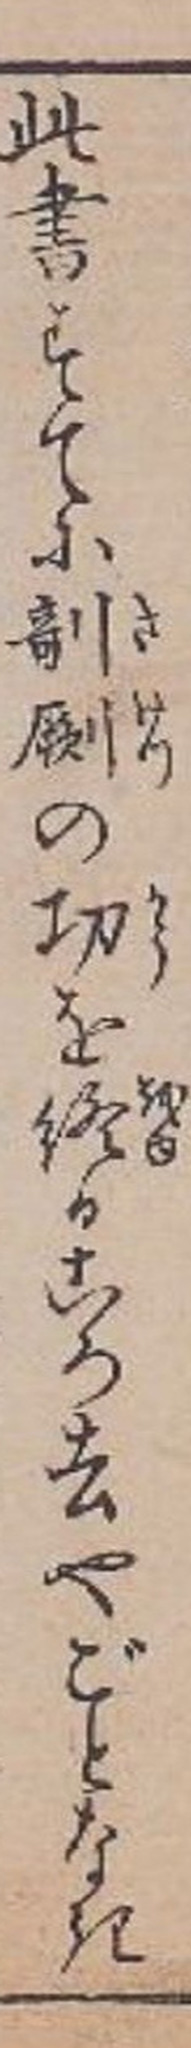此書すてに剞劂の功を終るころ去やごとなき
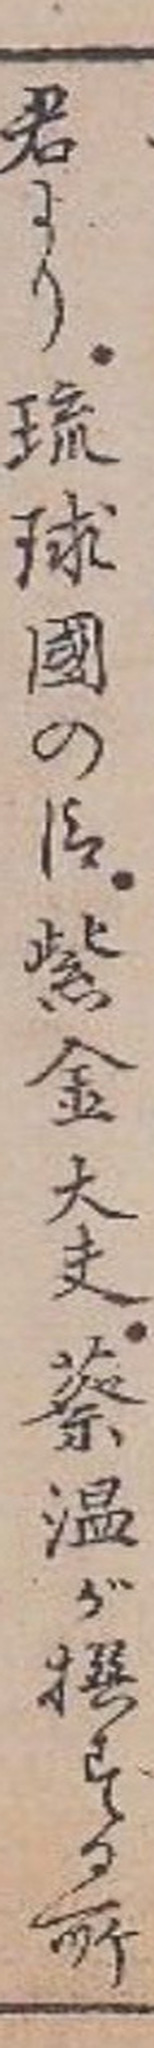君より、琉球国の臣、紫金大夫、蔡温が撰する所
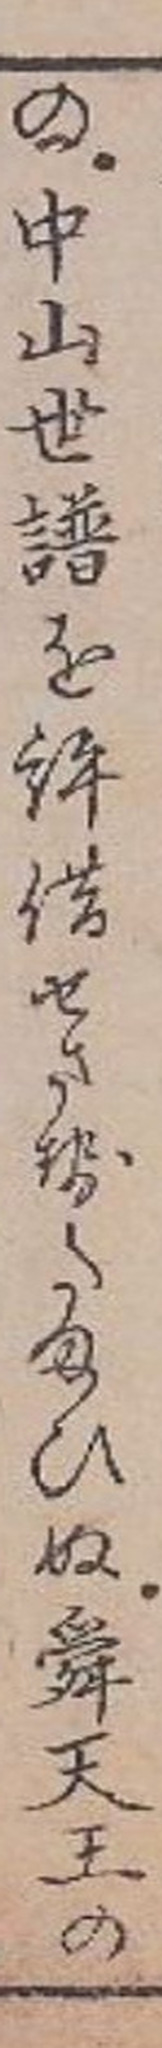の、中山世譜を拝借せさせたまひぬ、舜天王の
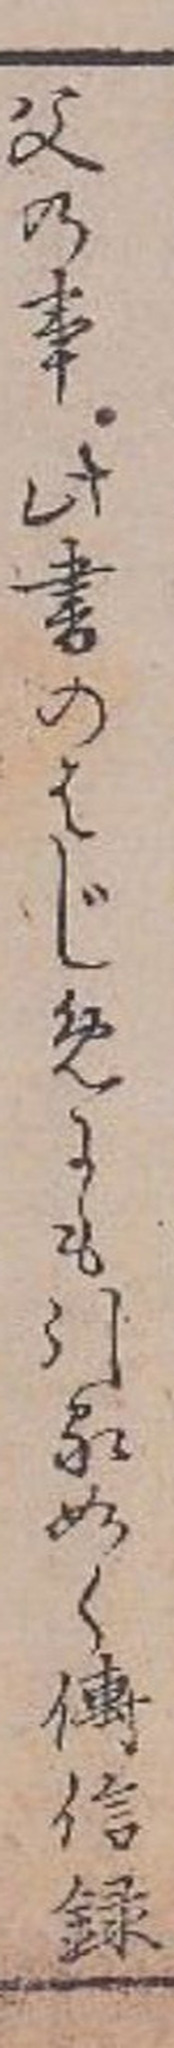父の事、此書のはじめにも引る如く伝信録
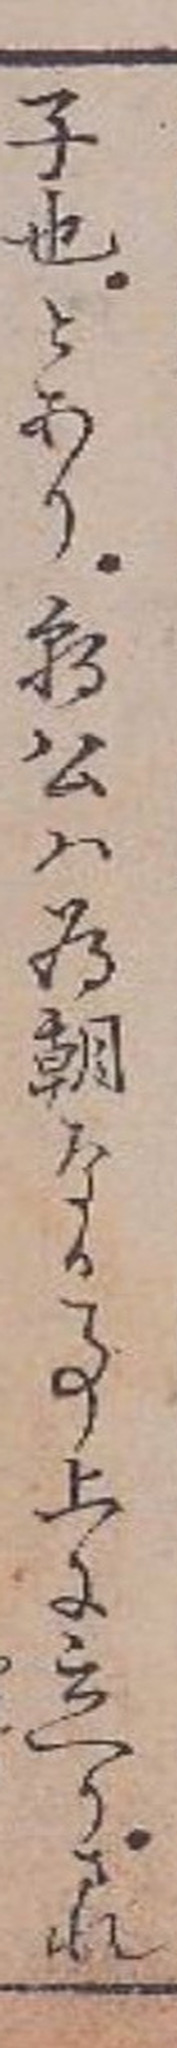子也、とあり、朝公は為朝なる事上に云へり、され
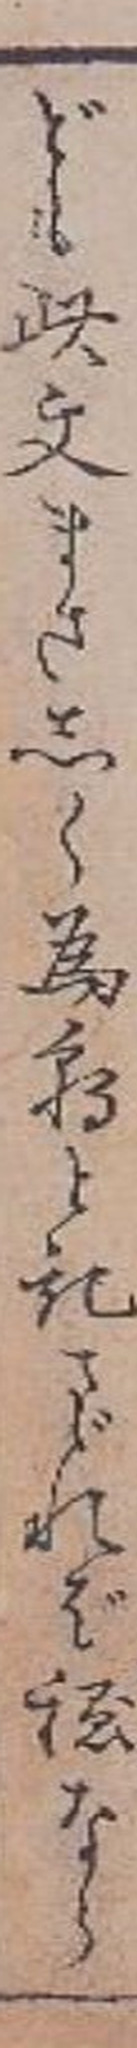ども此文まさしく為朝と記さゞれば穏なら

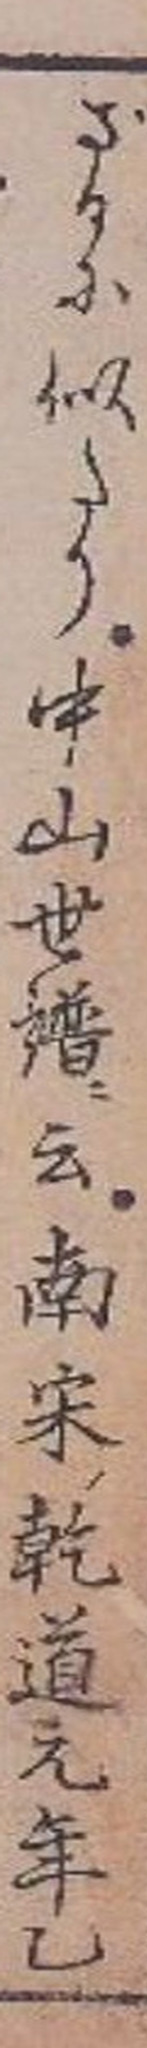ざるに似たり、中山世譜云、南宋乾道元年乙
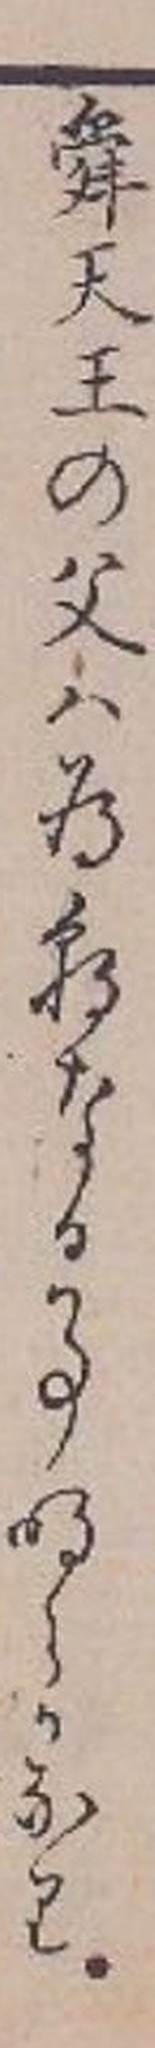舜天王の父は為朝なる事明らかなり、
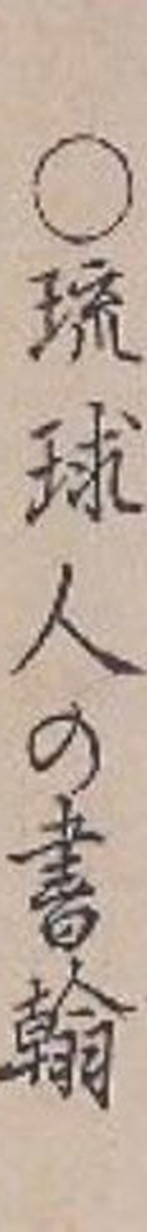○琉球人の書翰
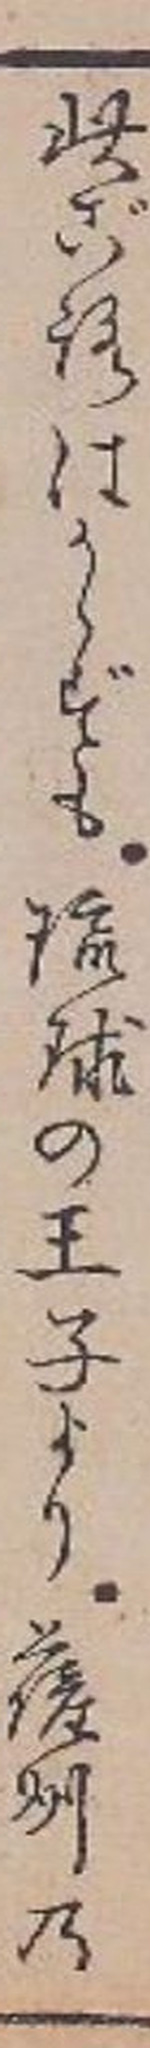此ごろはからずも、琉球の王子より、薩州の
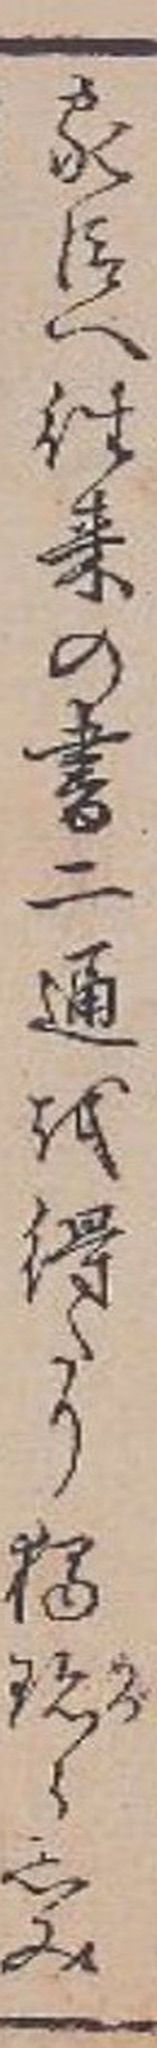家臣へ往来の書二通を得たり独珍らしみ
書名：琉球談
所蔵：University of the Ryukyus Library
